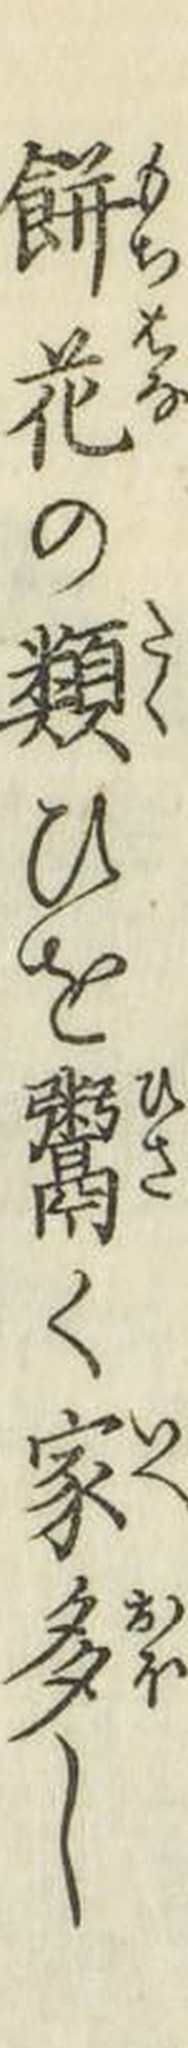餅花の類ひを鬻く家多し
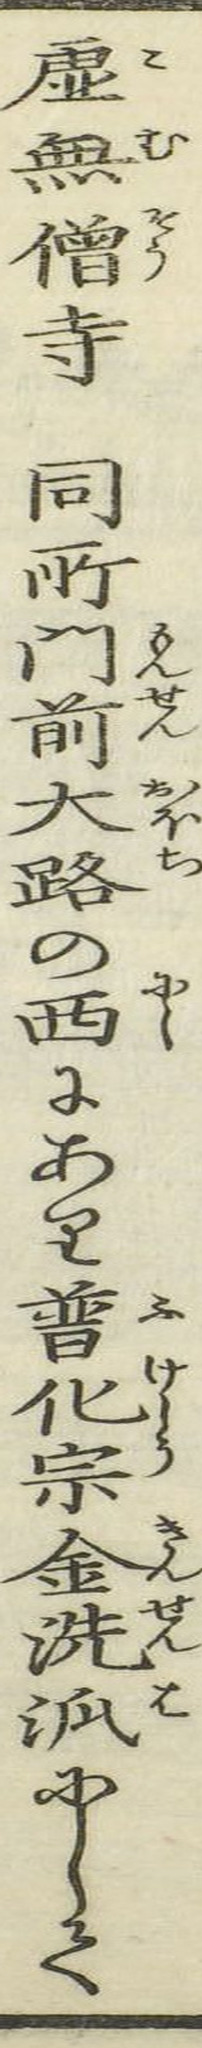虚無僧寺同所門前大路の西にあり普化宗金洗派にして
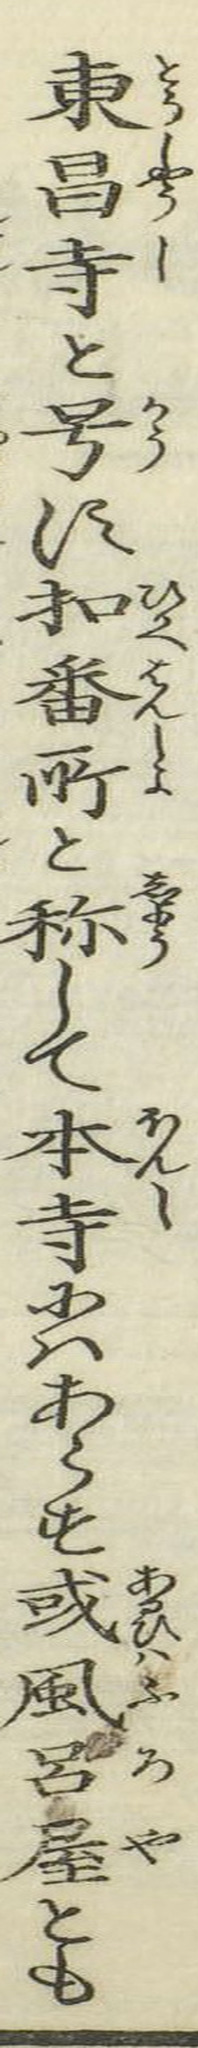東昌寺と号す扣番所と称して本寺にはあらす或風呂屋とも
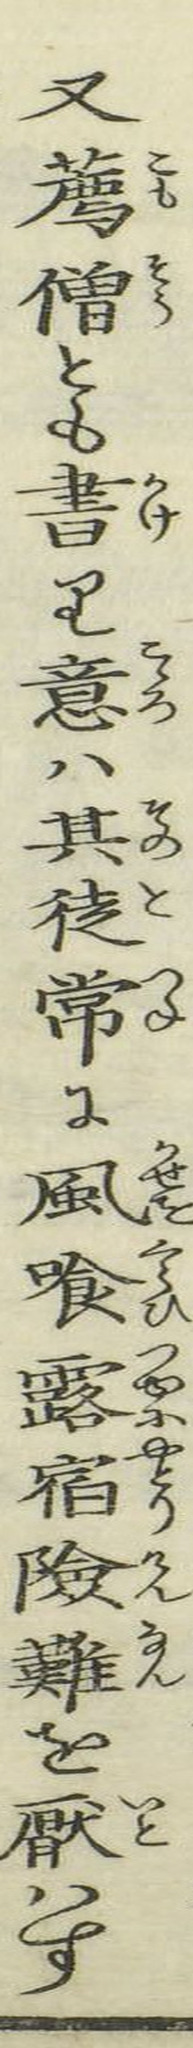又薦僧とも書り意は其徒常に風喰露宿險難を厭はす
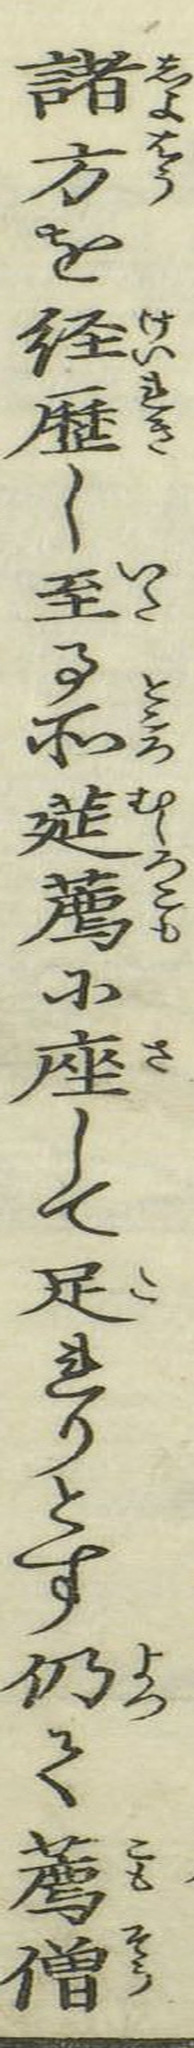諸方を経歴し至る所莚薦に座して足れりとす仍て薦僧
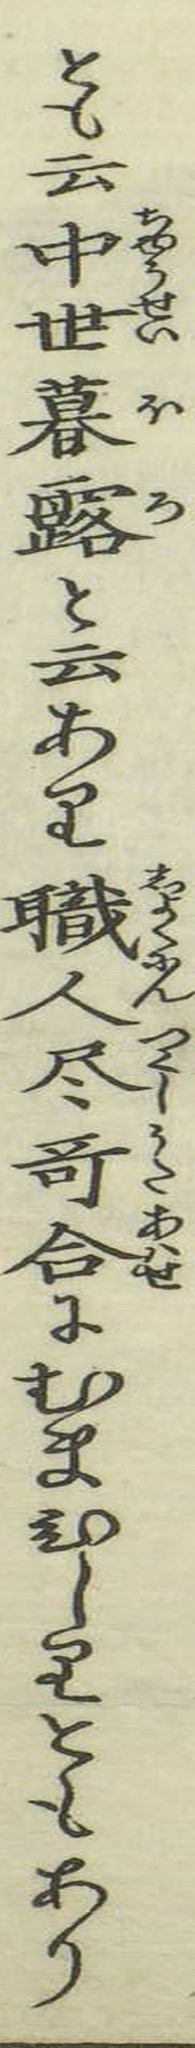とも云中世暮露と云あり職人尽哥合にむまひしりともあり

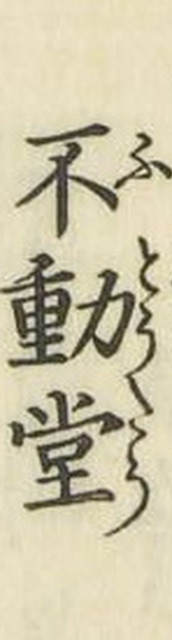不動堂

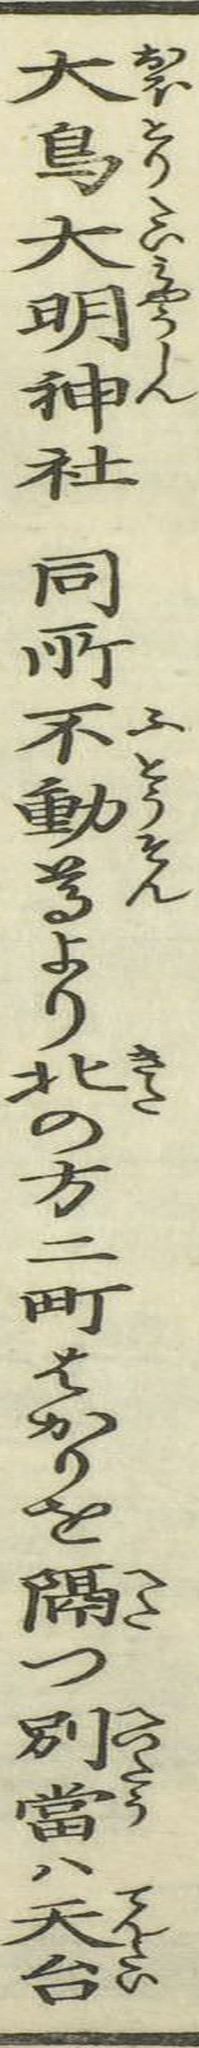大鳥大明神社同所不動尊より北の方二町はかりを隔つ別當は天台
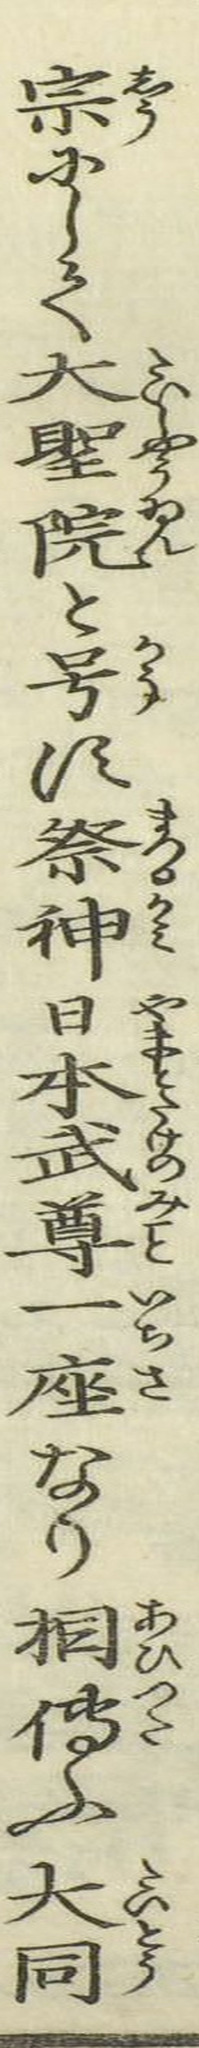宗にして大聖院と号す祭神日本武尊一座なり相傳ふ大同
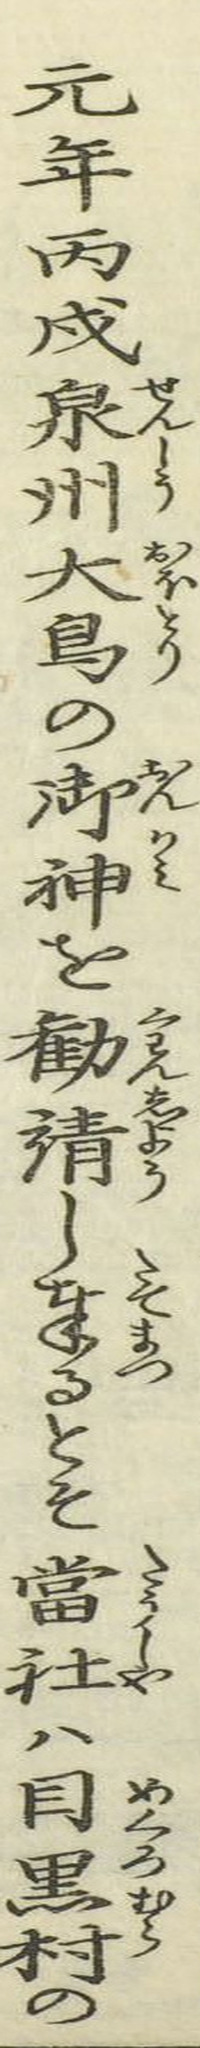元年丙戌泉州大鳥の御神を勧請し奉とそ當社は目黒村の
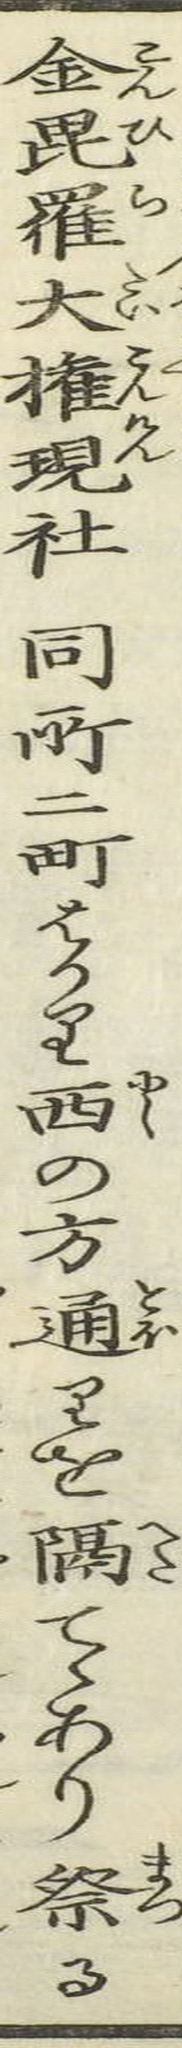金毘羅大権現社同所二町はかり西の方通りを隔てゝあり祭る
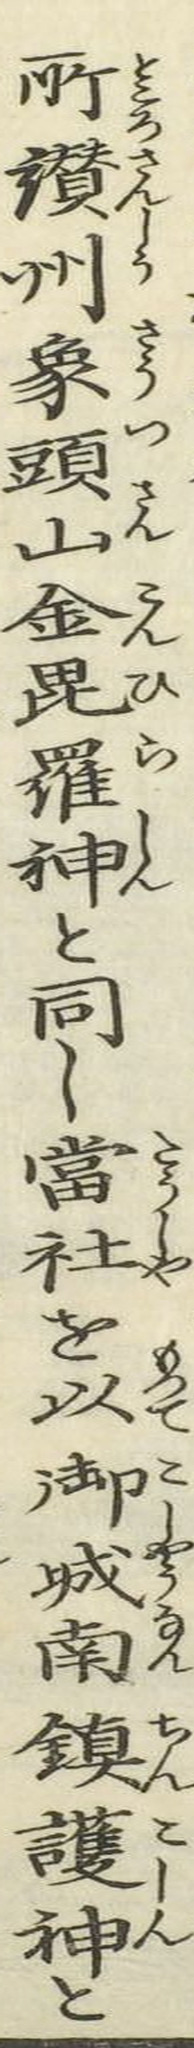所讃州象頭山金毘羅神と同し當社を以御城南鎮護神と
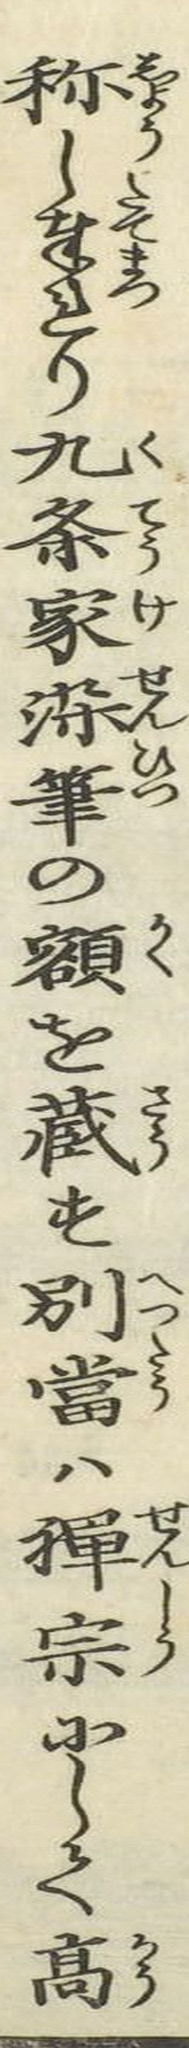称し奉れり九条家染筆の額を藏す別當は禪宗にして髙
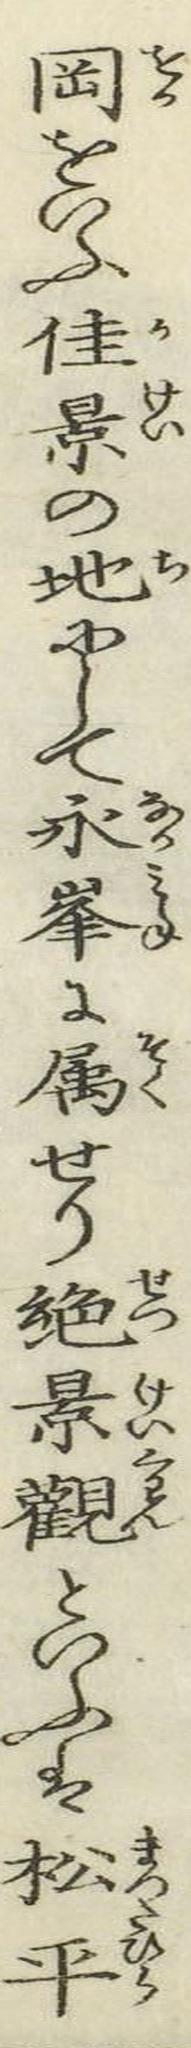岡をいふ佳景の地にして永峯に属せり絶景觀といふは松平
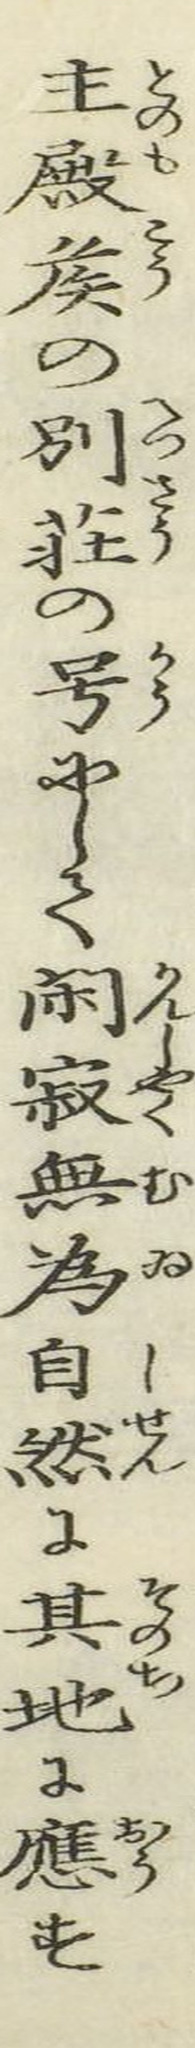主殿矦の別荘の号にして閑寂無為自然に其地に應す
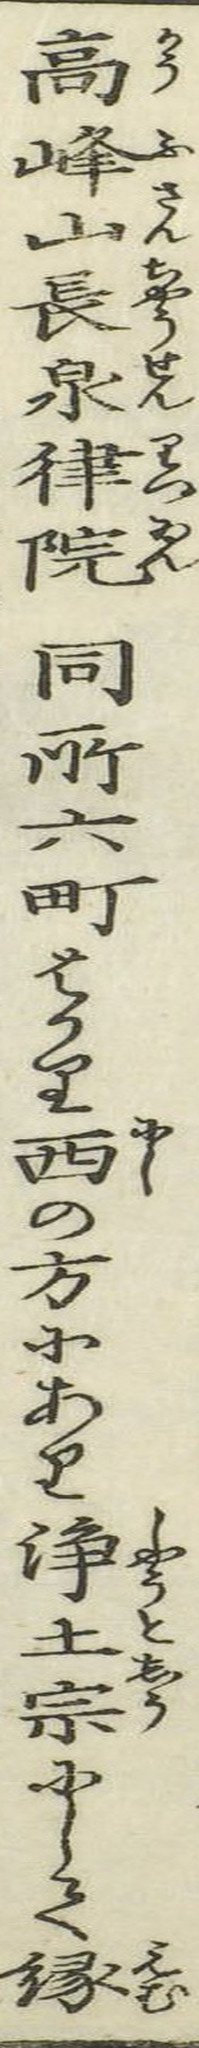高峰山長泉律院同所六町はかり西の方にあり浄土宗にして縁
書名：江戸名所図会 20巻 巻之7
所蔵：東京学芸大学教育コンテンツアーカイブ
